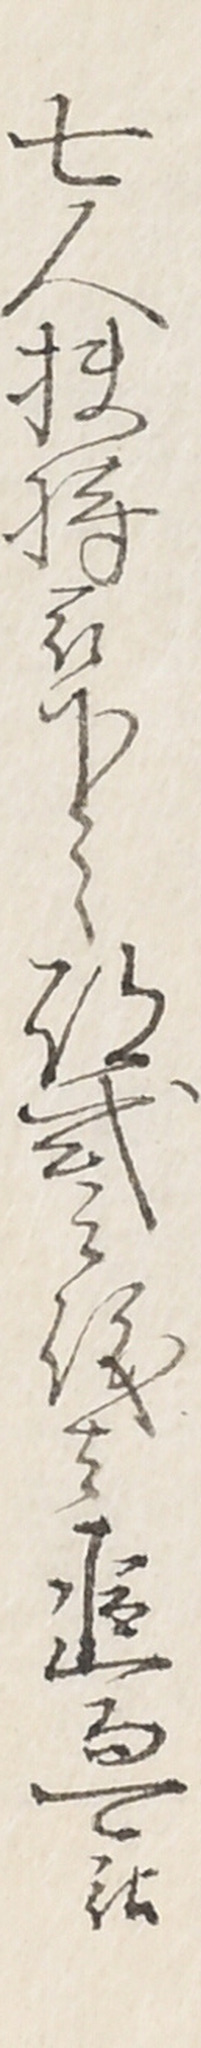七人扶持被下之跡式之儀は追而可被
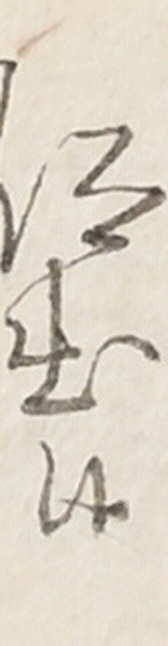仰出候
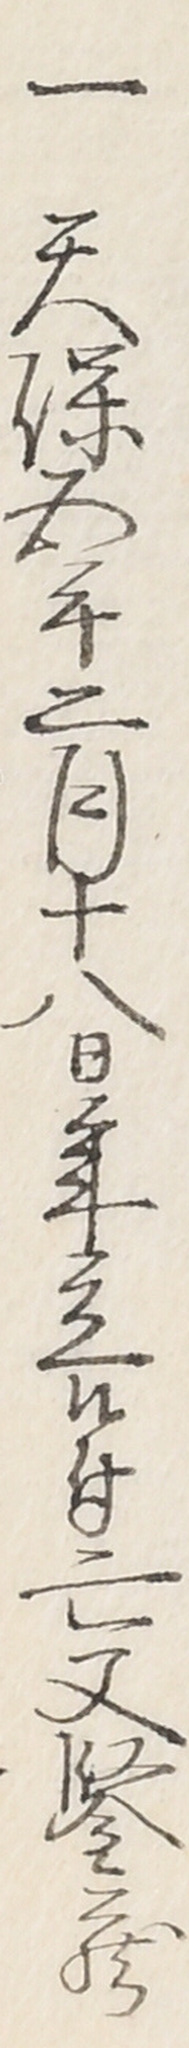一天保五午二月十八日年立候付亡父鋻蔵
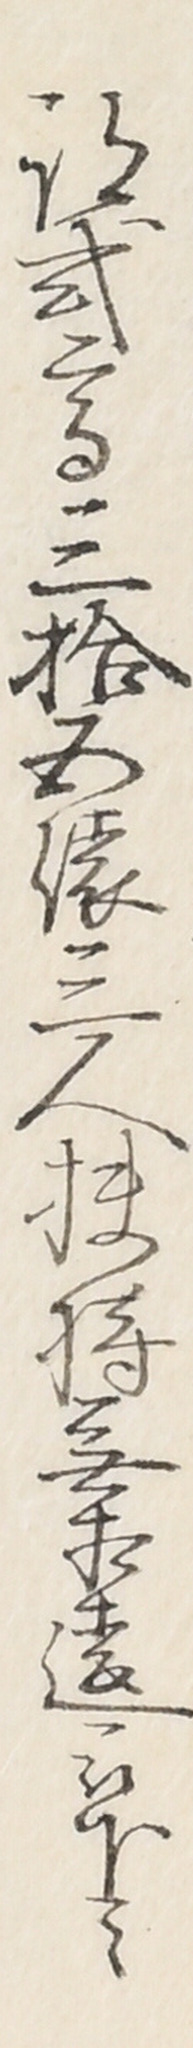跡式高三拾五俵三人扶持無相違被下之
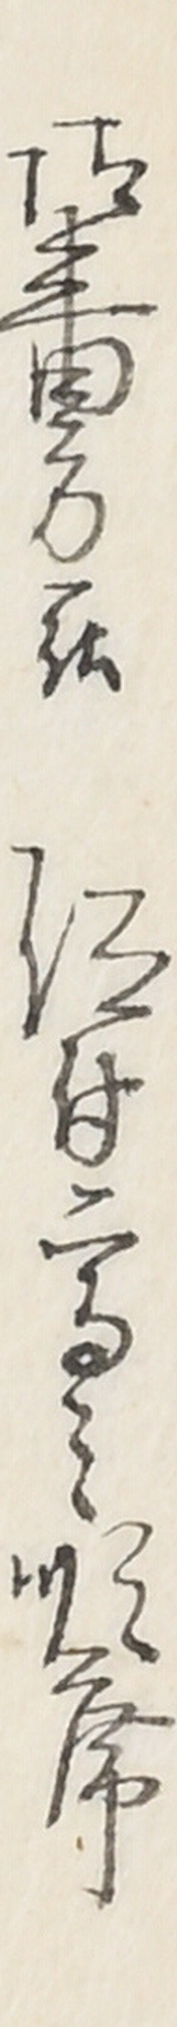御番方被仰付高之順席
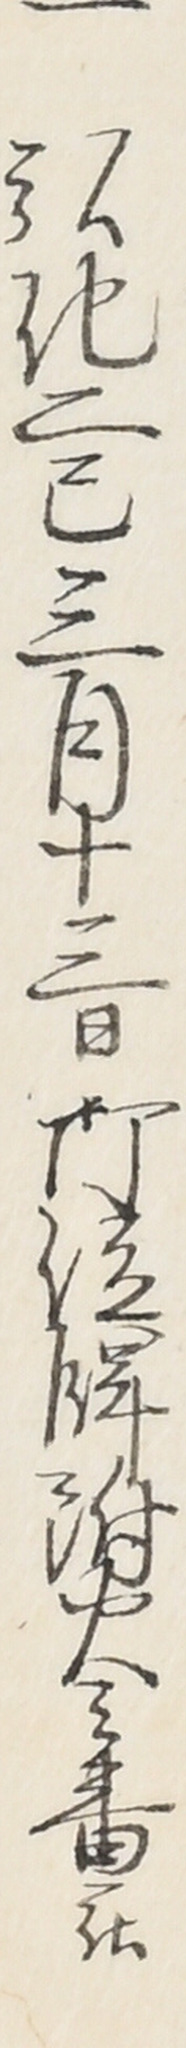一弘化二巳三月十三日御位牌附火之番被
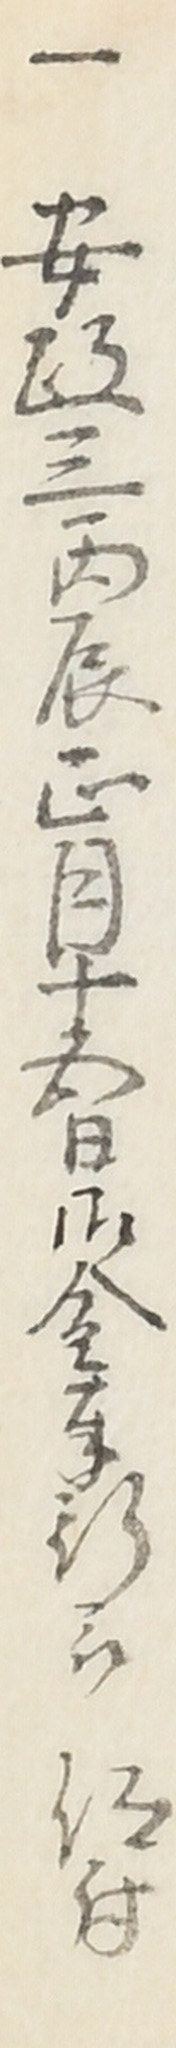一安政三丙辰正月十五日御金奉行被仰付

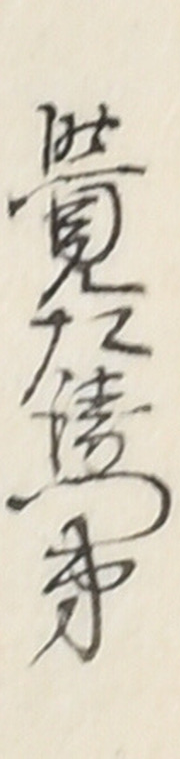覚左衛門弟
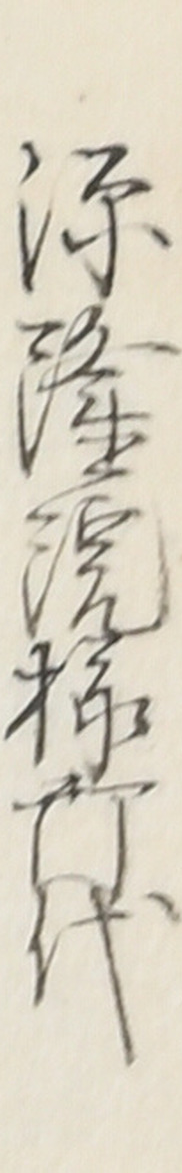源隆院様御代
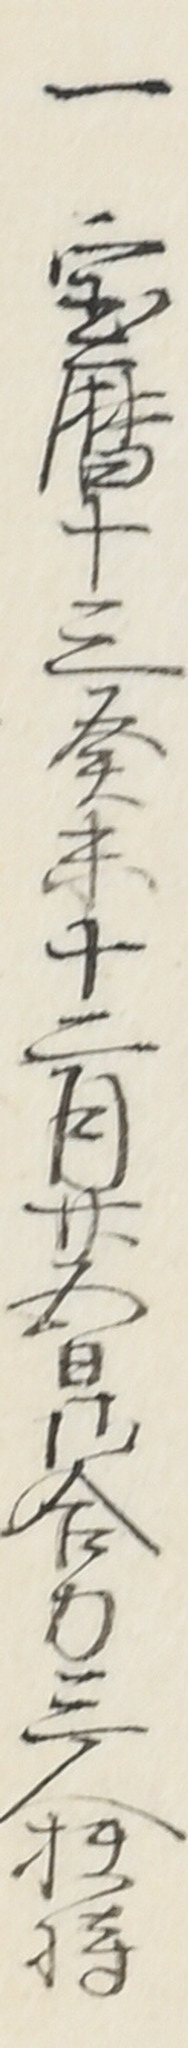一宝暦十三癸未十二月廿五日御合力三人扶持
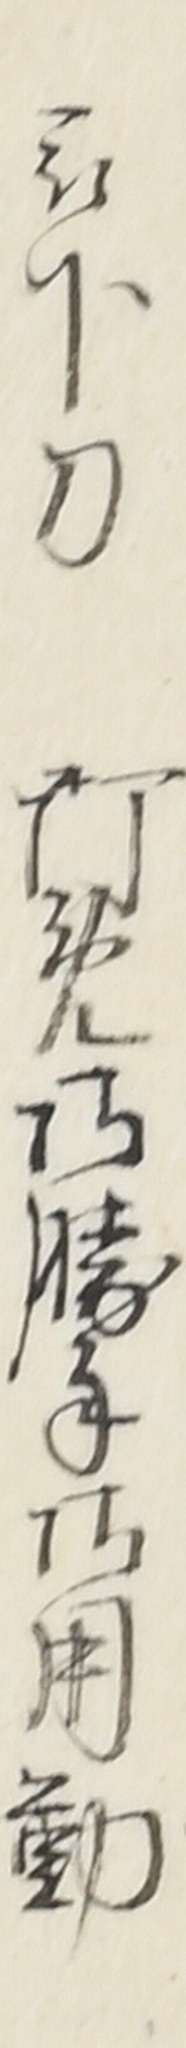被下刀御免御勝手御用勤
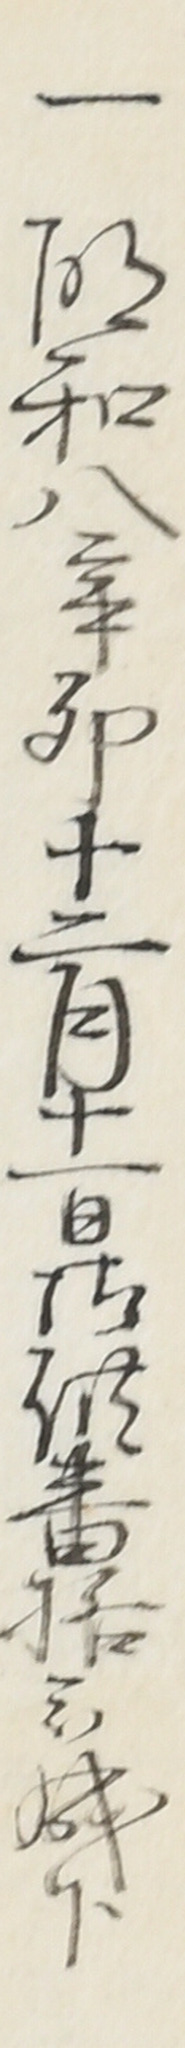一明和八辛卯十二月十一日御供番格被成下
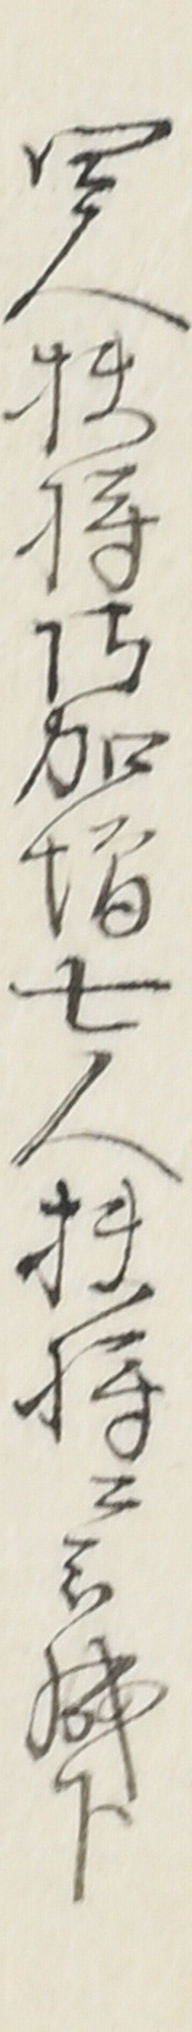四人扶持御加増七人扶持ニ而成下
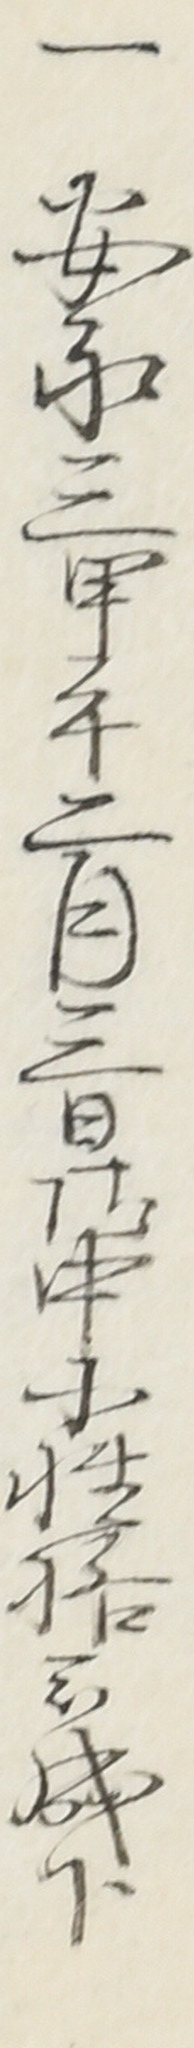一安永三甲午二月三日御中小性格被成下
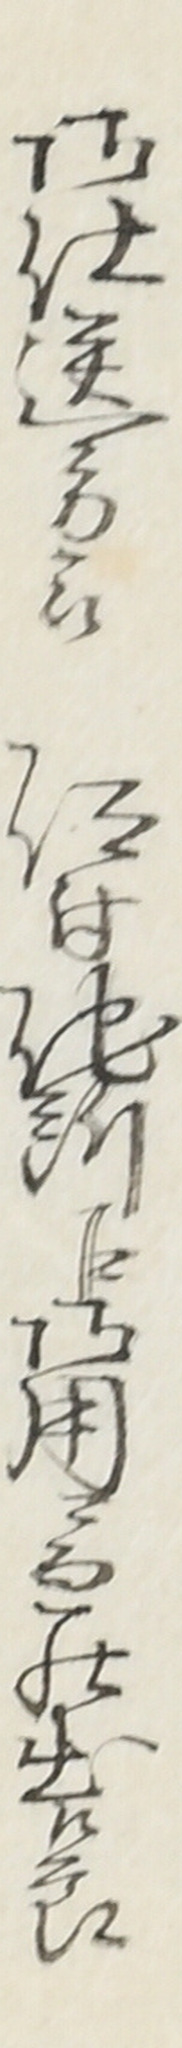御仕送方被仰付他所江御用ニ而罷出候節
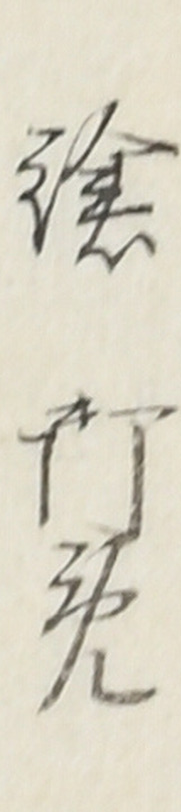鎗御免
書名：給人諸士勤仕録（七）
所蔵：伊那市立高遠町図書館・合同会社AMANE
